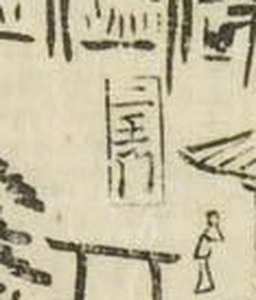二王門
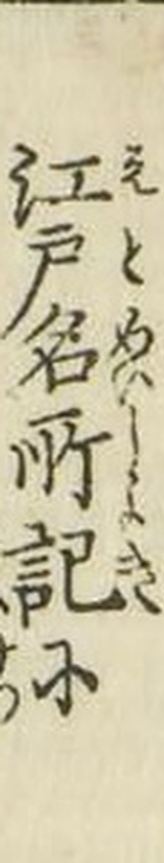江戸名所記に
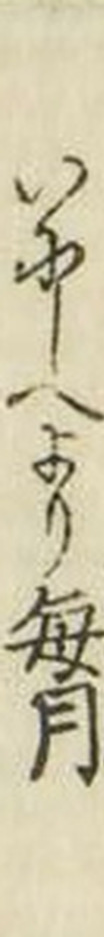いにしへより毎月
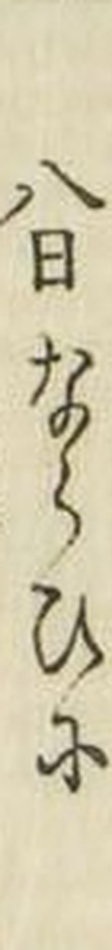八日ならひに
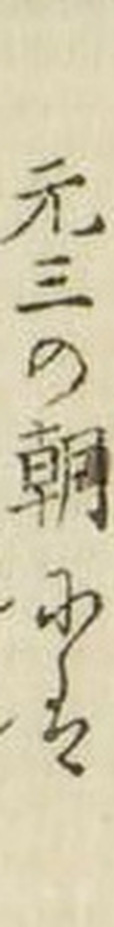元三の朝には
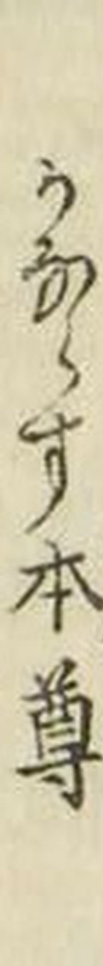かならす本尊
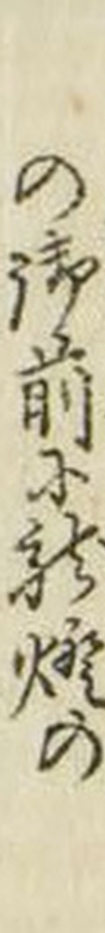の御前に竜灯の
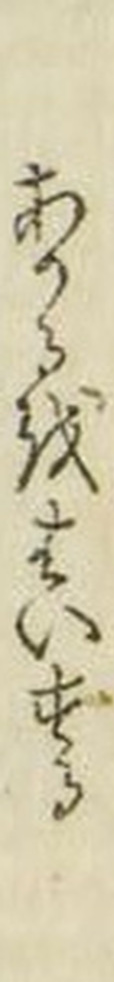あかるをはいする
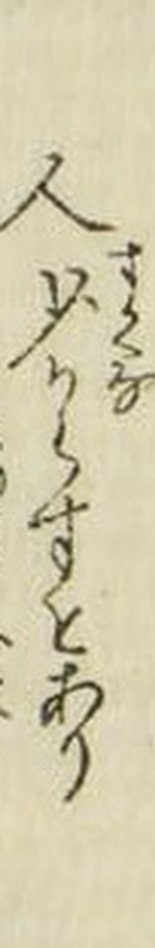人少からすとあり
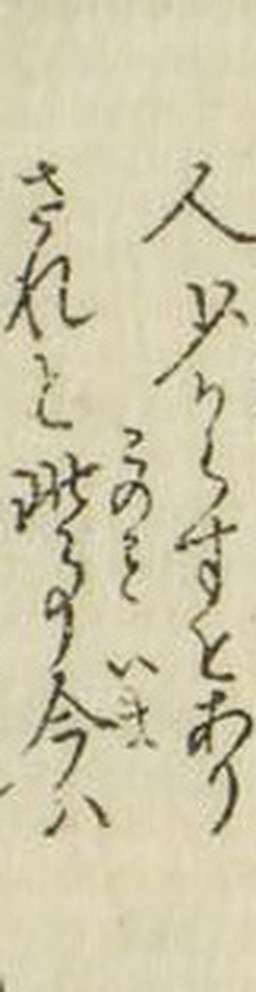されと此事今は
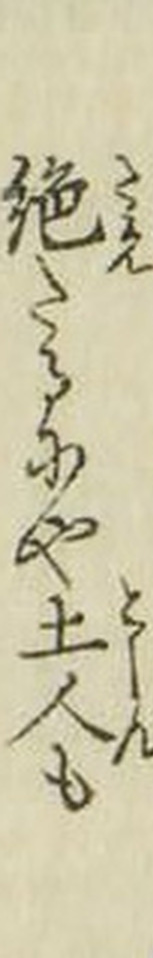絶たるにや土人も
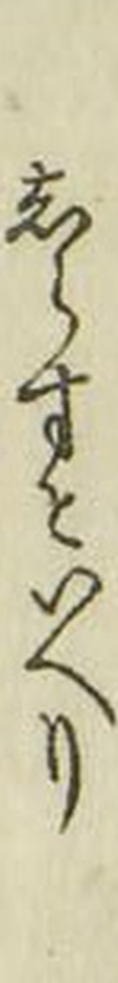しらすといへり

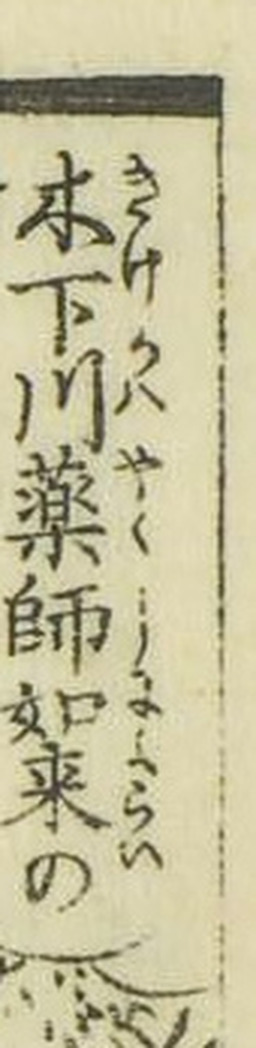木下川薬師如来の
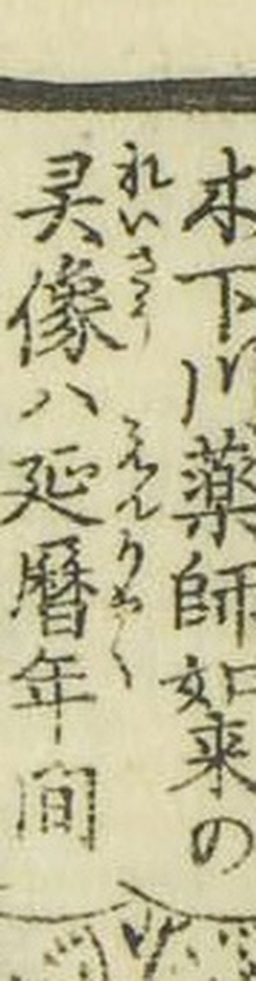霊像は延暦年間の
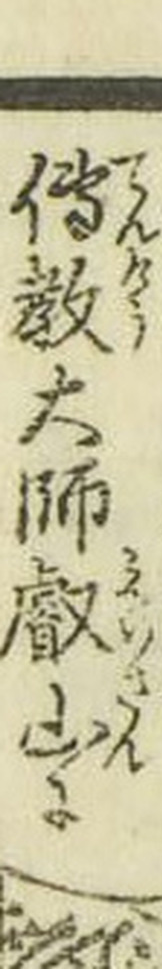伝教大師叡山に
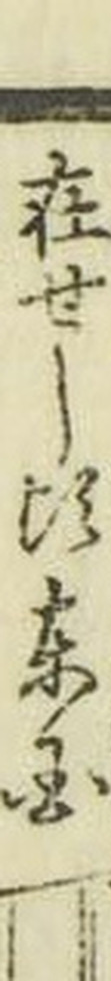在せし頃東国
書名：江戸名所図会 20巻 巻之19
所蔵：東京学芸大学教育コンテンツアーカイブ
